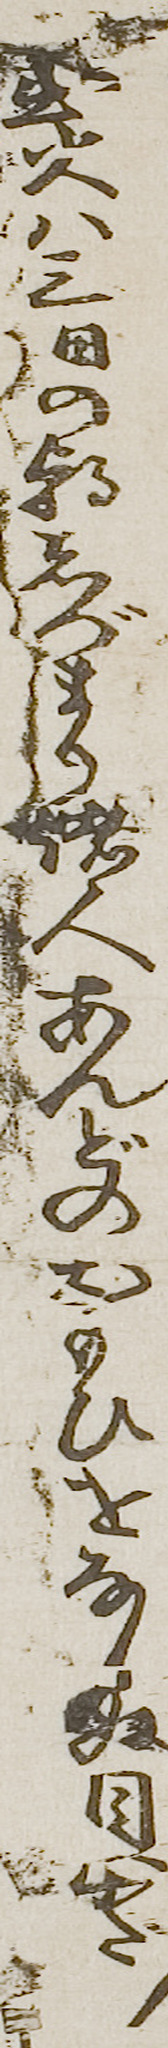す火は三日の朝しづまり諸人あんどのおもひをなしぬ目出たし
